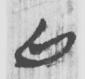㠯（以）
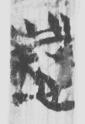憮
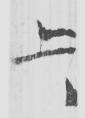上
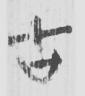古
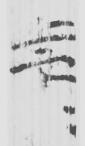{上下}=
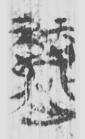{麗出}
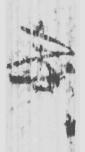志
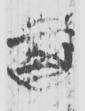百
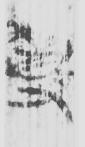事
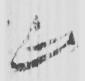㠯（以）
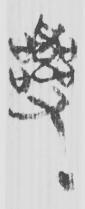𠧏（亂）
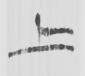上
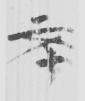不
